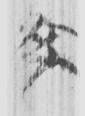交
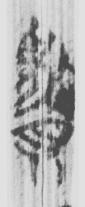{賜攴}
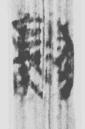則
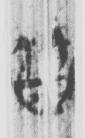皆
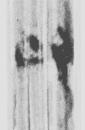又
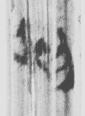利
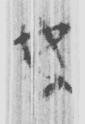𡚦
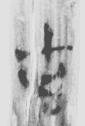古
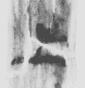上
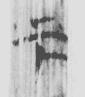下
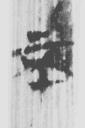不
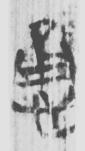悀
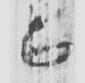㠯（以）
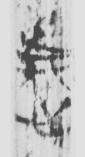𢝬
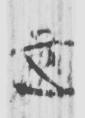正
